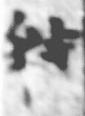牧
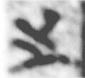之
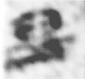厽（參）
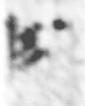匹
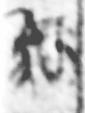駒
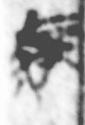駟
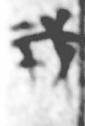戎
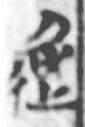○（路）
